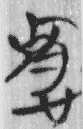○（怨）
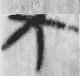不
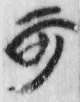可
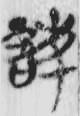○（證）
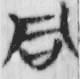同
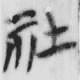社
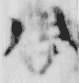同
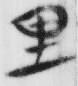里
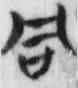同
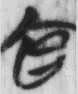官
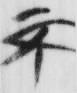不
